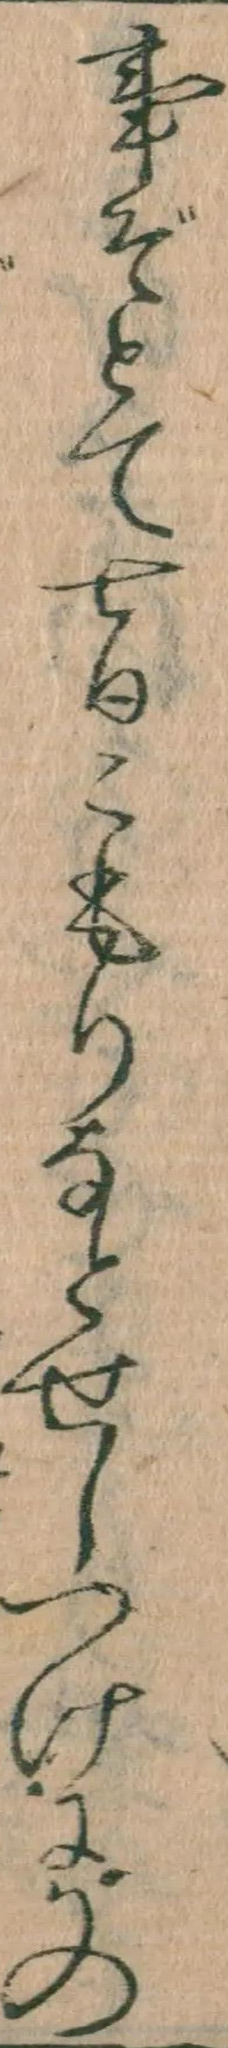事ぞとて七日こもりなとせしつけに、かの
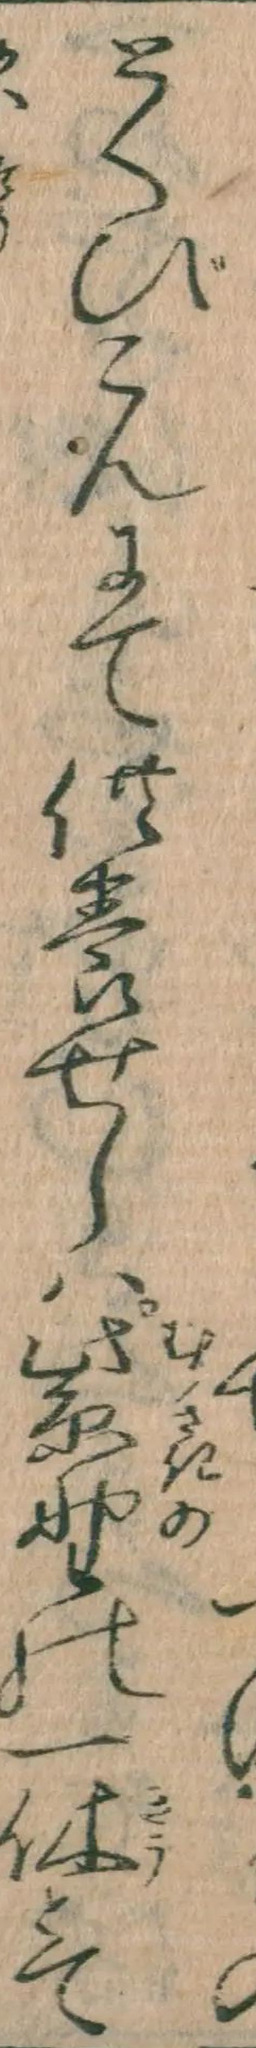とくびこんにて供養せしは。紫野の一休とて
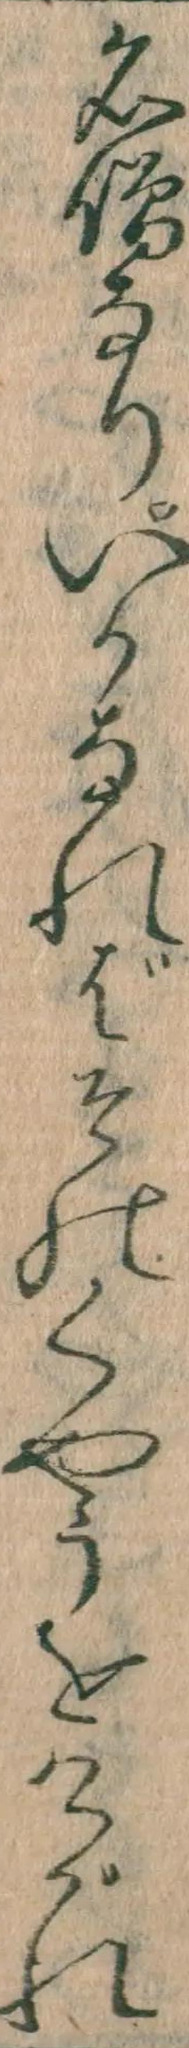名僧なり。いかなればそのくやうをけがれ
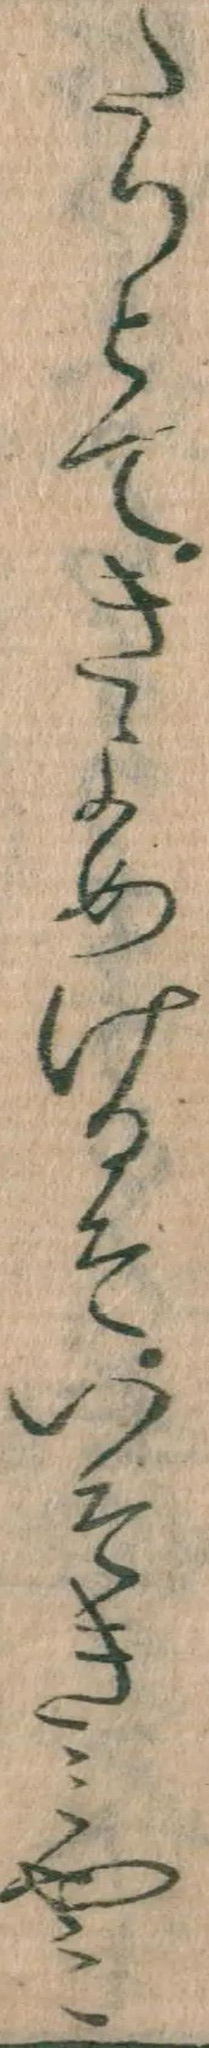たりとて、きよめけるそ、いそきみやこ
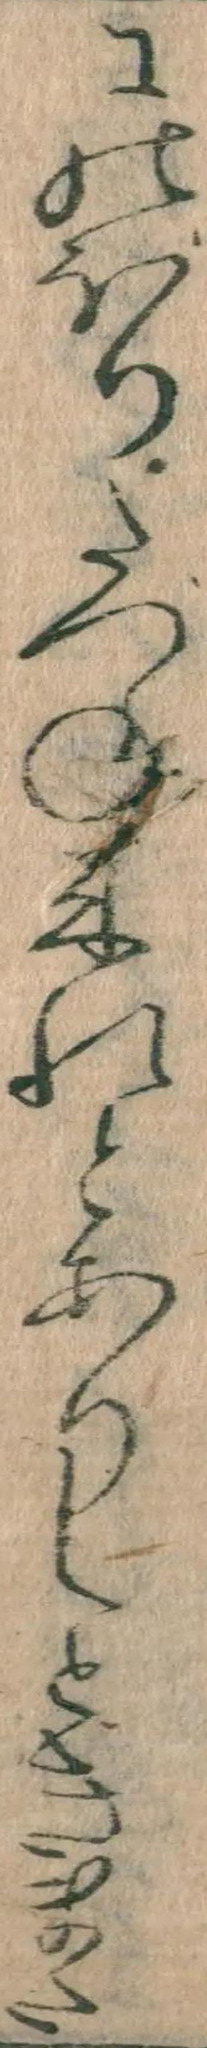にのぼり、たつね来れとありしときまた
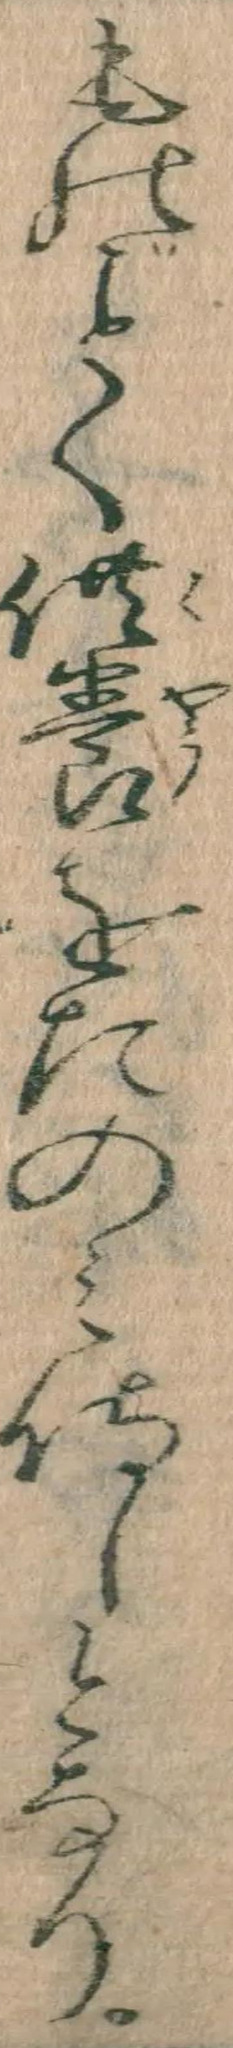ものごとく供養をたのみ侍しとなり。
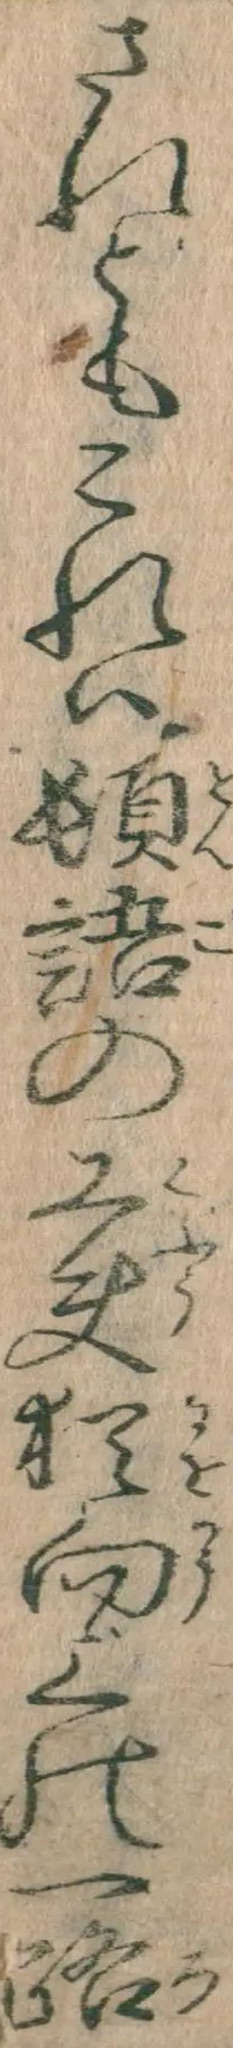されどもこれは、頓語の工夫猶向上の一路
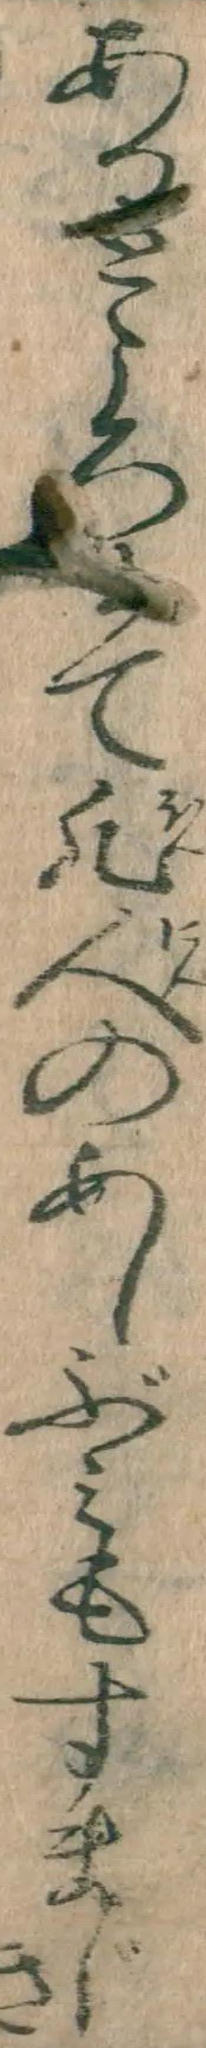あるところにて凡人のあしぶみもすまじき
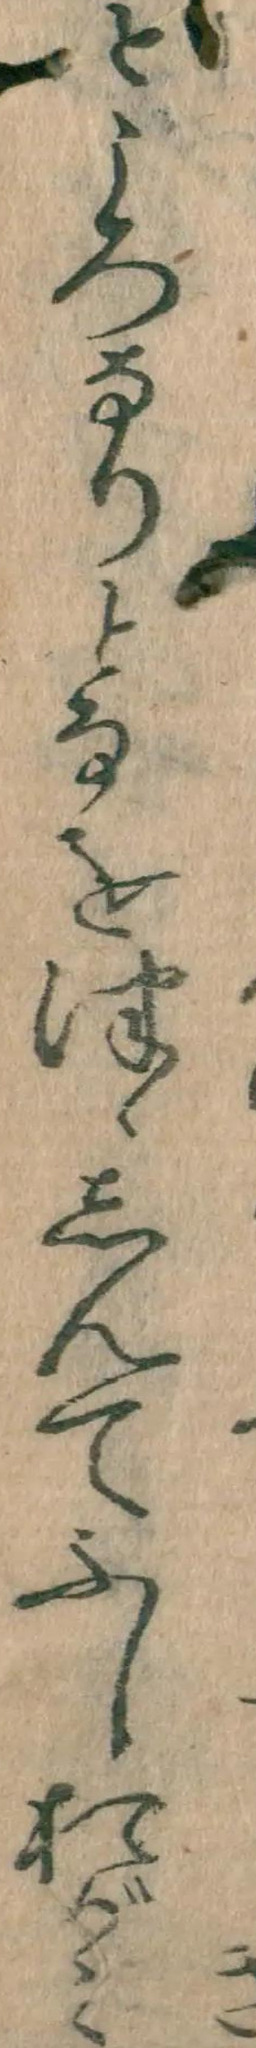ところなりとなをつゝしんてふしおがみ

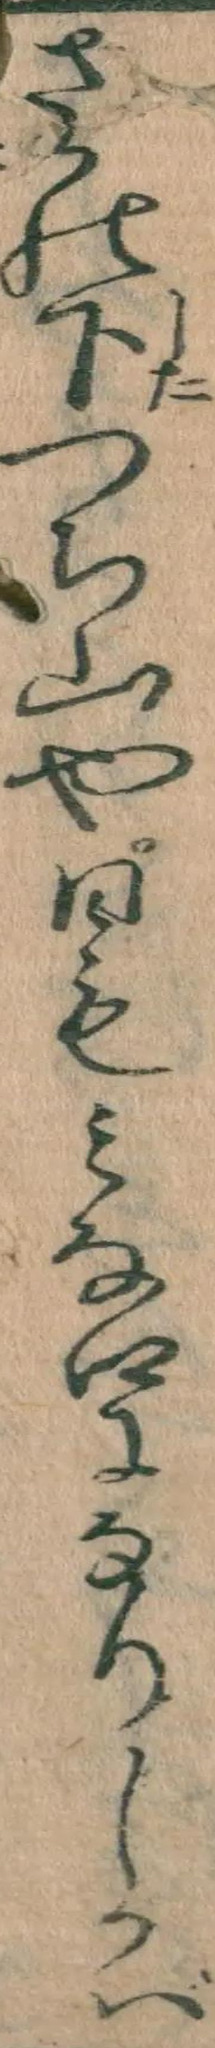さかの下つち山や。日もみな口になりしかば
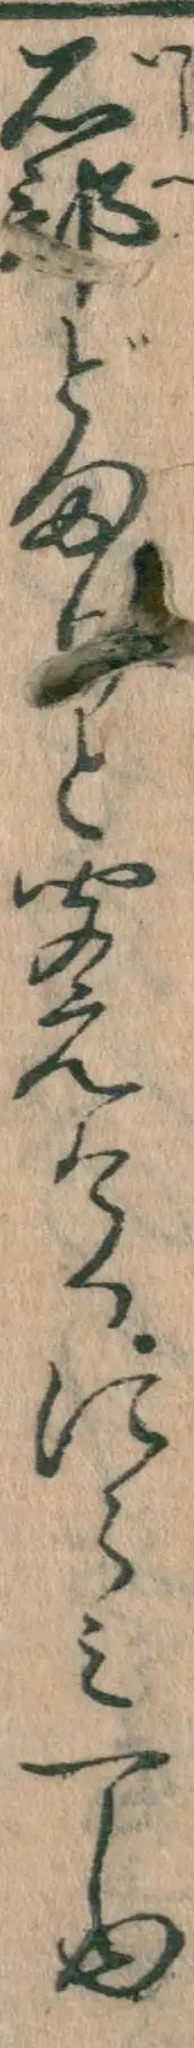石部どまりと聞えける。にらみ一しゆ
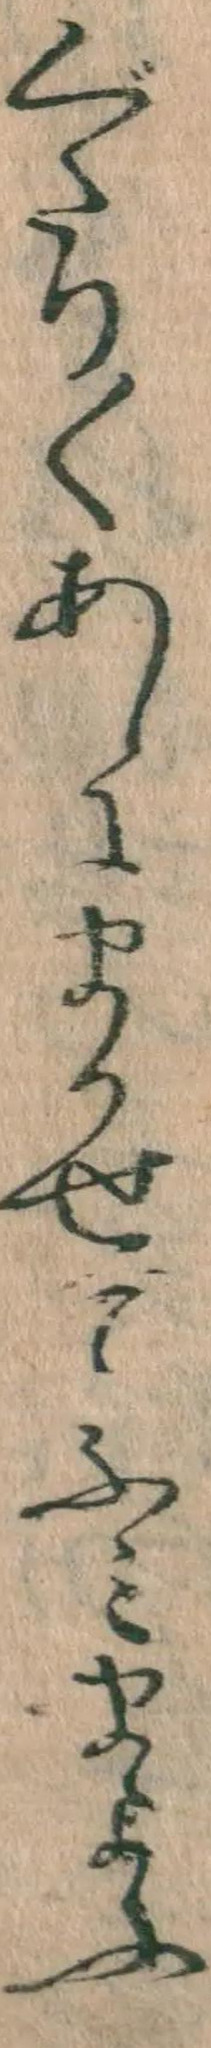くだり〳〵あしにまかせてふみまよふ
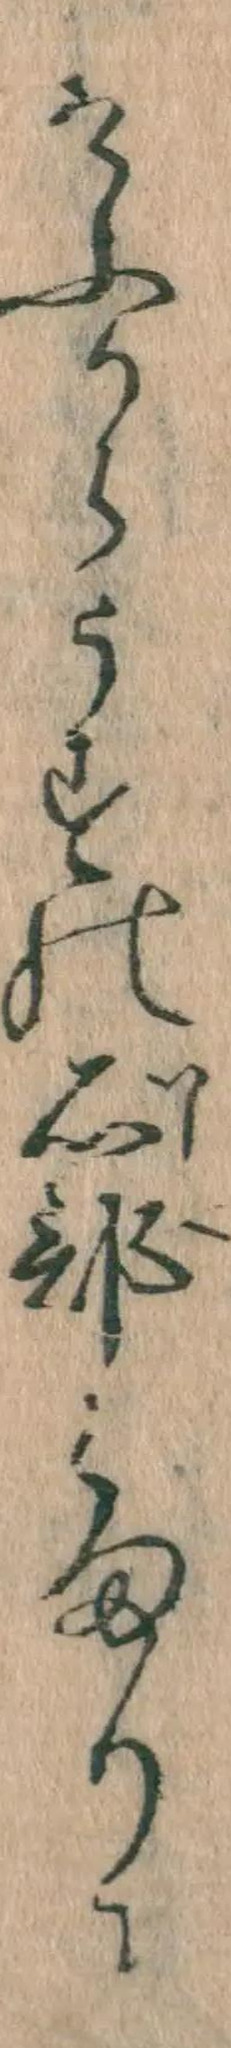けふからうすの石部とまりに
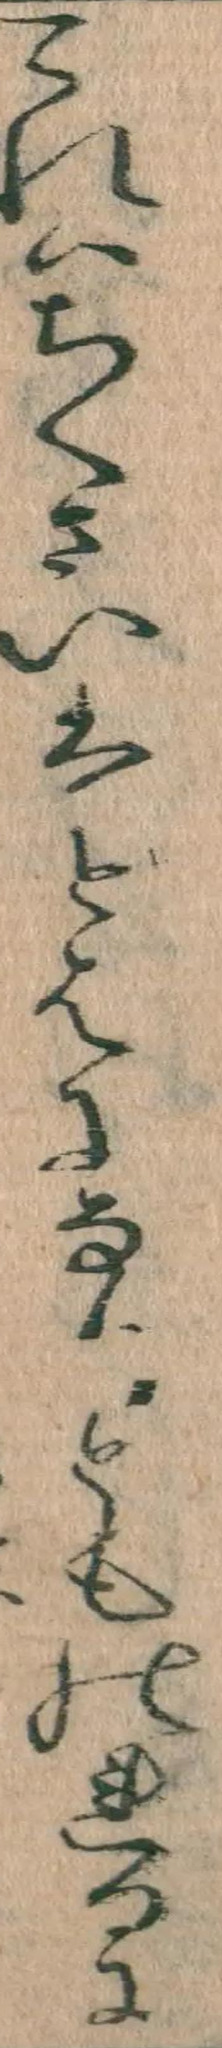これはちくさいはとはになりとものれるに
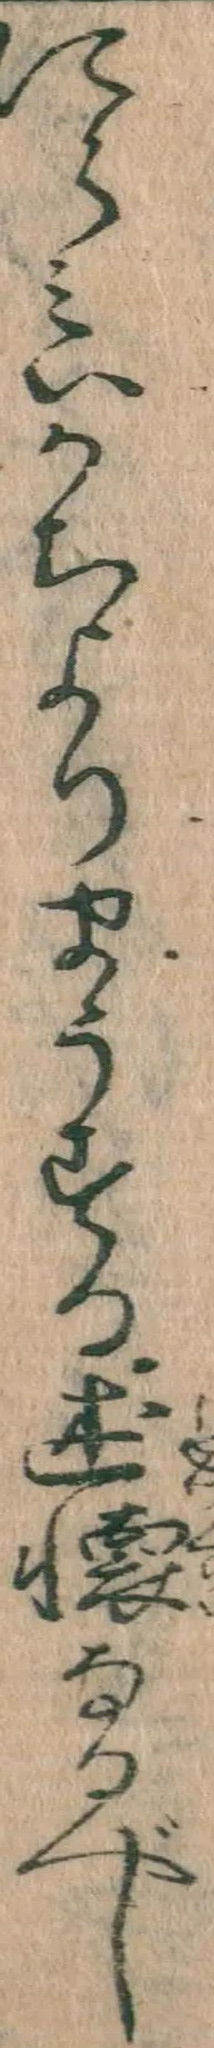にらみはかちよりまうする、述懐なるべし
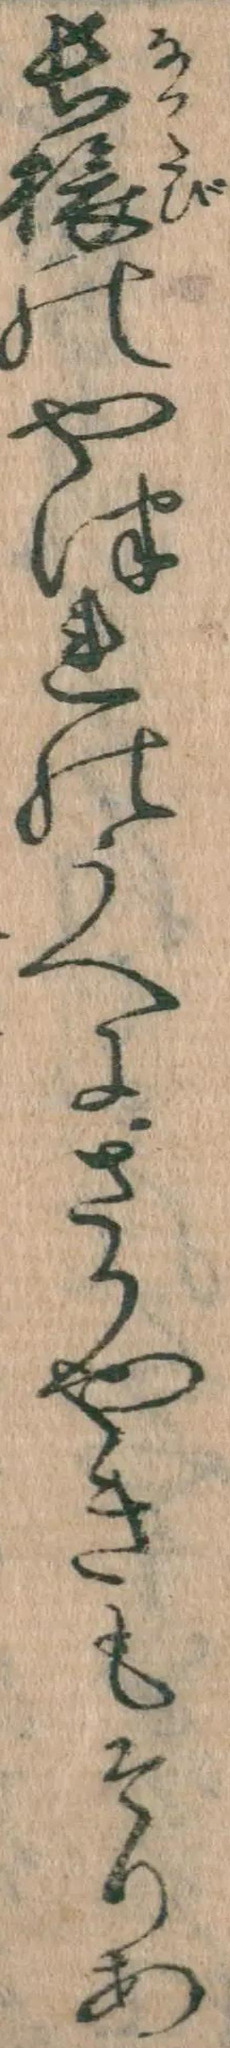長旅のやつれのうへに、さかやきもそりあ
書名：竹斎狂歌物語 3巻
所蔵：国立国会図書館 National Diet Library, JAPAN
